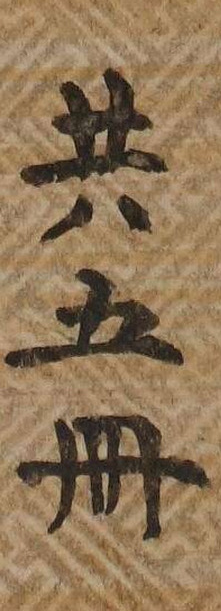共五冊

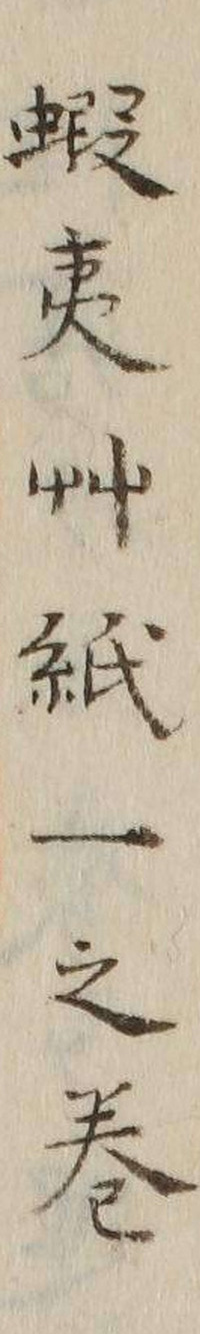蝦夷草紙一之巻
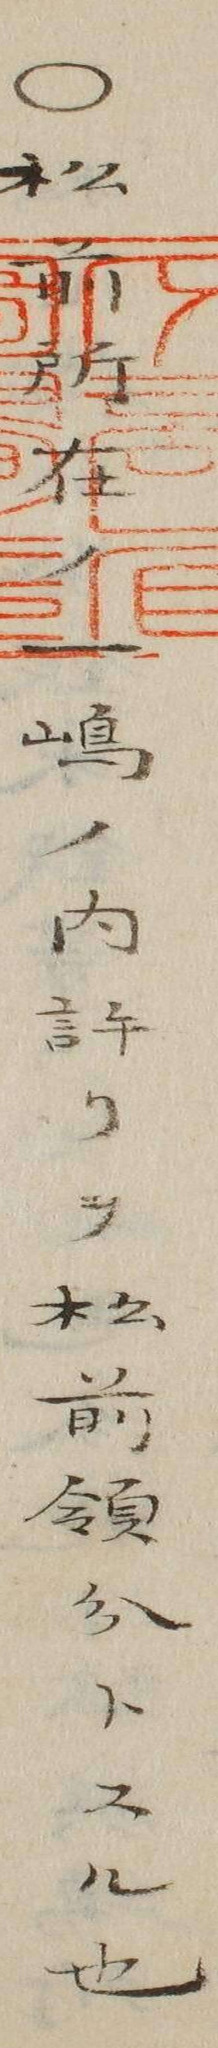〇松前所在ノ一島ノ内許リヲ松前領分トスル也
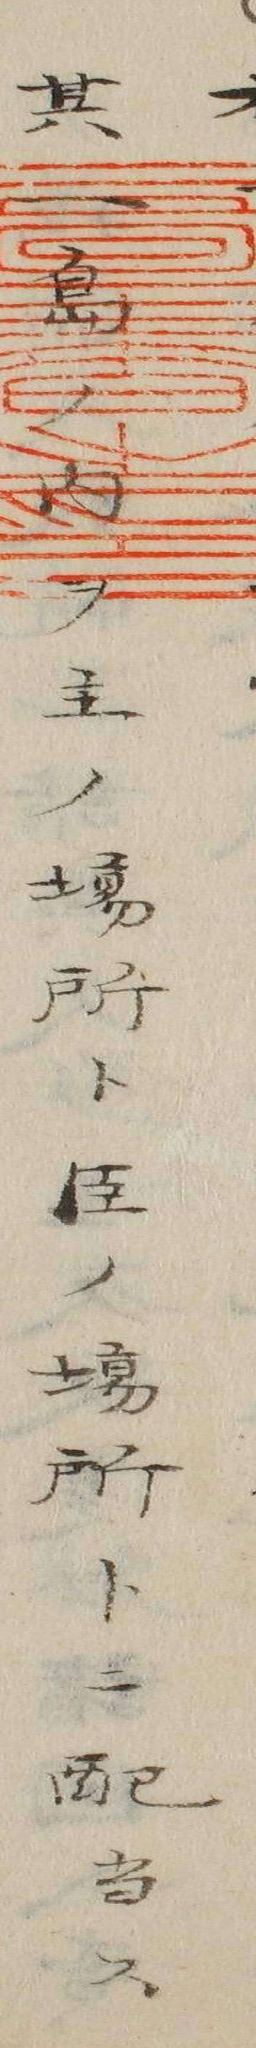其一島ノ内ヲ主ノ場所ト臣ノ場所トニ配当ス
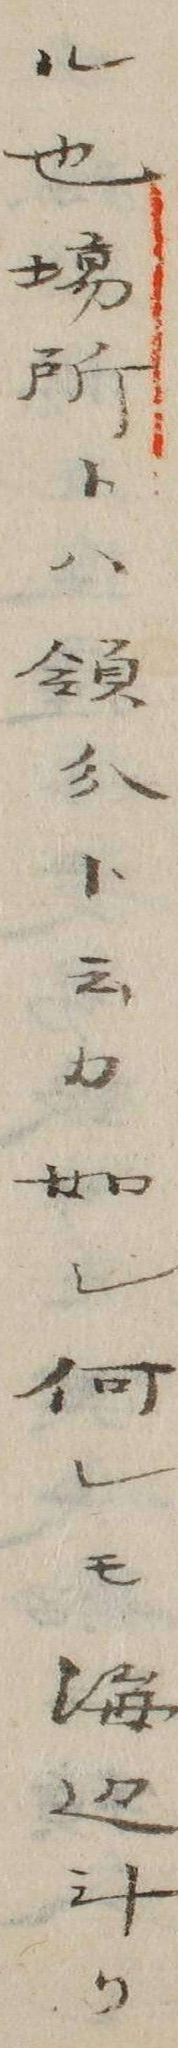ル也場所トハ領分ト云カ如シ何レモ海辺計リ
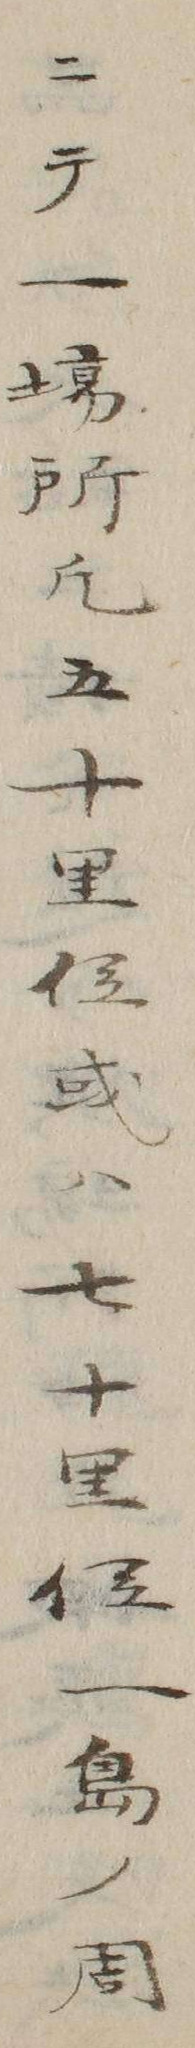ニテ一場所凡五十里位或ハ七十里位一島ノ周
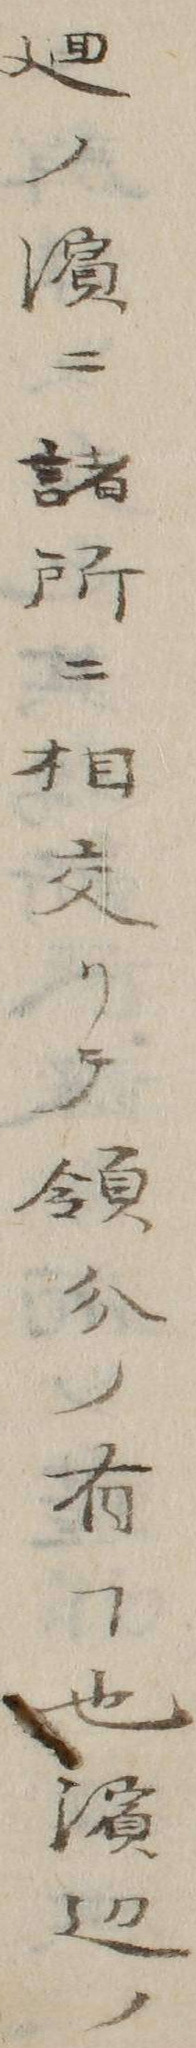廻ノ浜ニ諸所ニ相交リテ領分ノ有コト也浜辺ノ
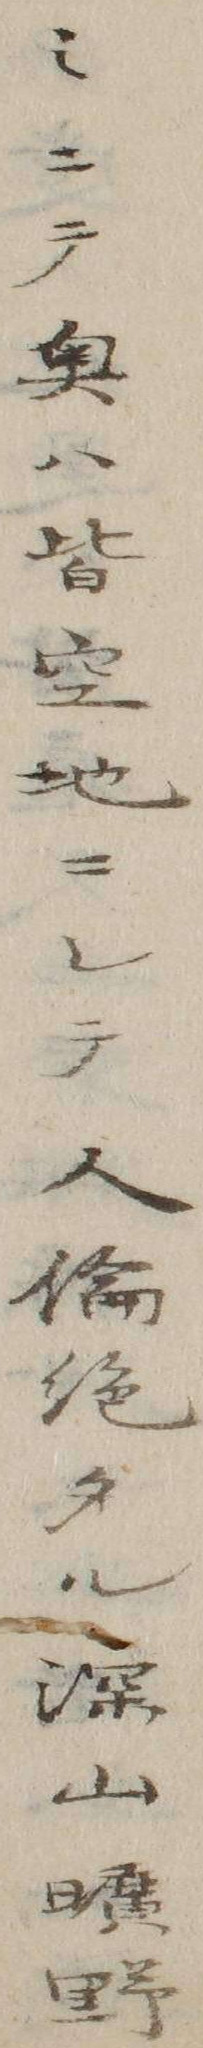ミニテ奥ハ皆空地ニシテ人倫絶タル深山曠野
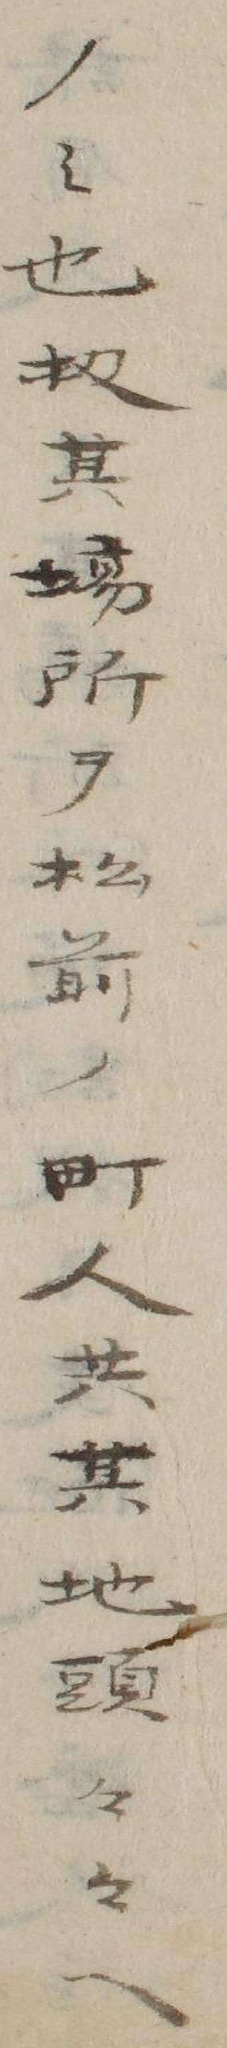ノミ也扨其場所ヲ松前ノ町人共其地頭々々ヘ
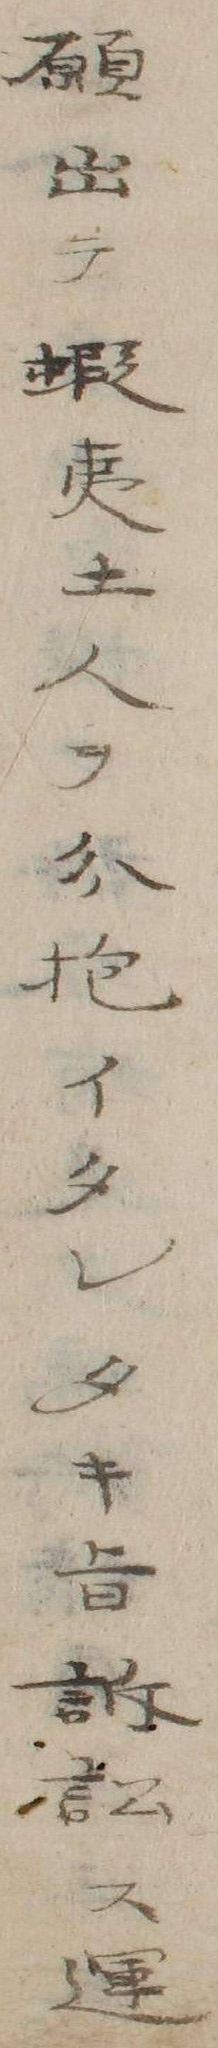願出テ蝦夷土人ヲ介抱イタシタキ旨訴訟ス運

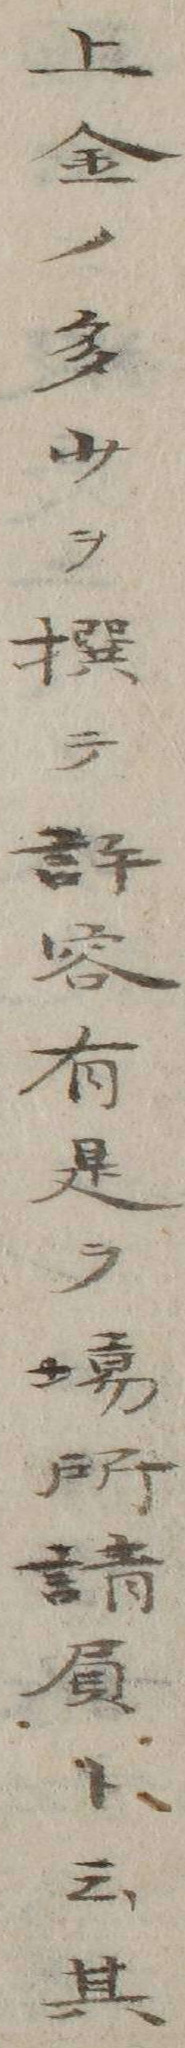上金ノ多少ヲ撰テ許容有是ヲ場所請負ト云其
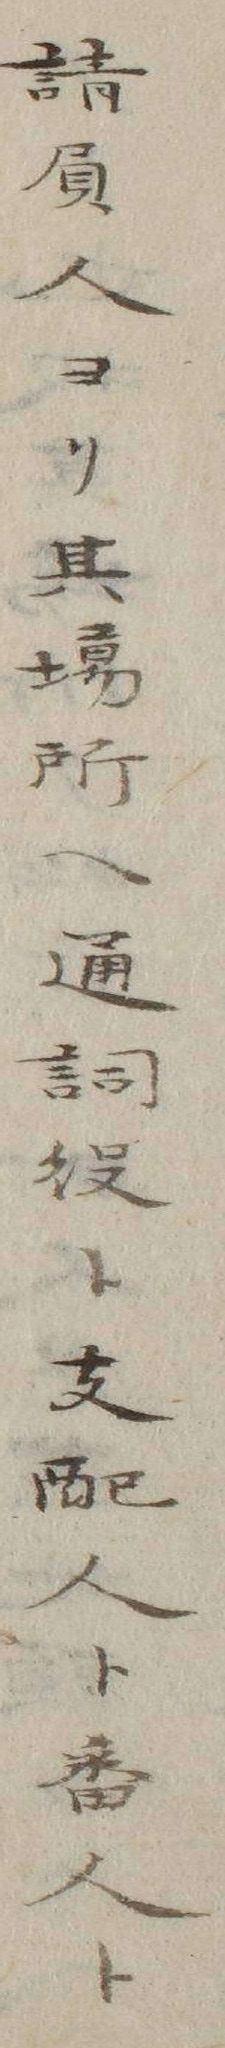請負人ヨリ其場所ヘ通詞役ト支配人ト番人ト
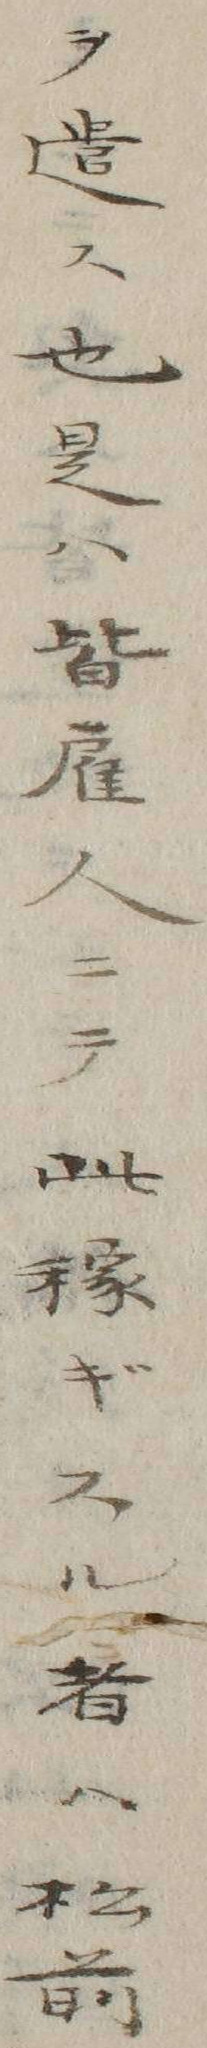ヲ遣ス也是ハ皆雇人ニテ此稼ギスル者ハ松前
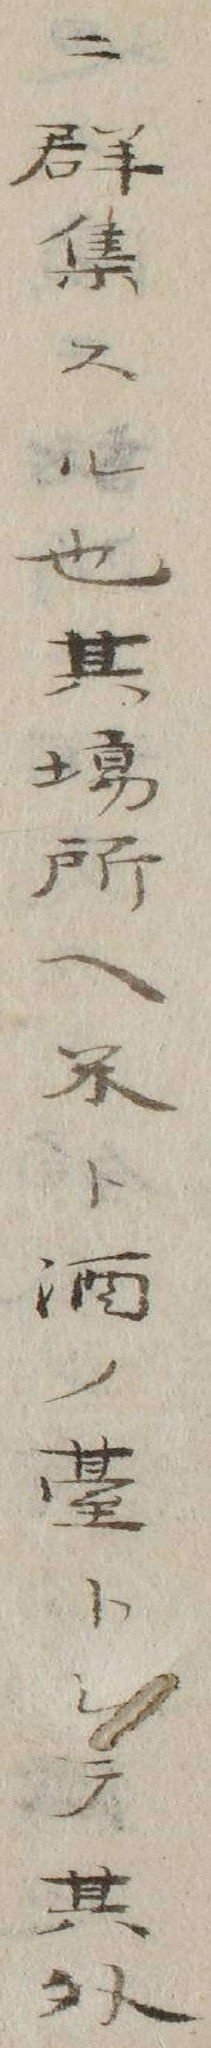ニ群集スル也其場所ヘ米ト酒ノ台トシテ其外
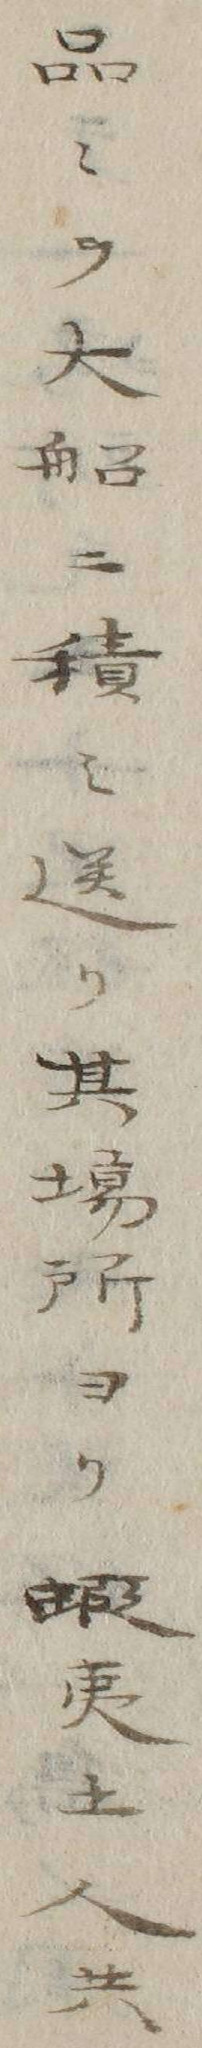品々ヲ大船ニ積ミ送リ其場所ヨリ蝦夷土人共
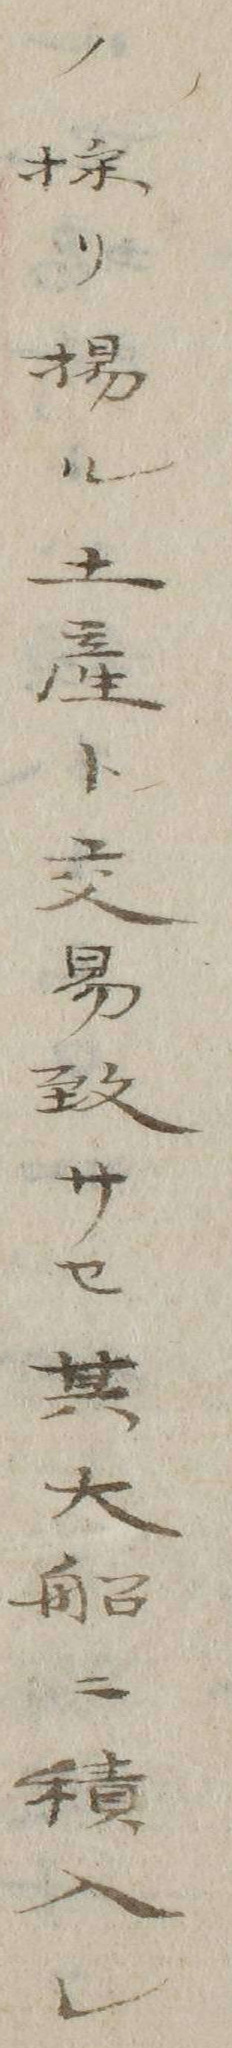ノ採リ揚ル土産ト交易致サセ其大船ニ積入レ
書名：蝦夷草紙（国文学研究資料館）
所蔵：国文学研究資料館
